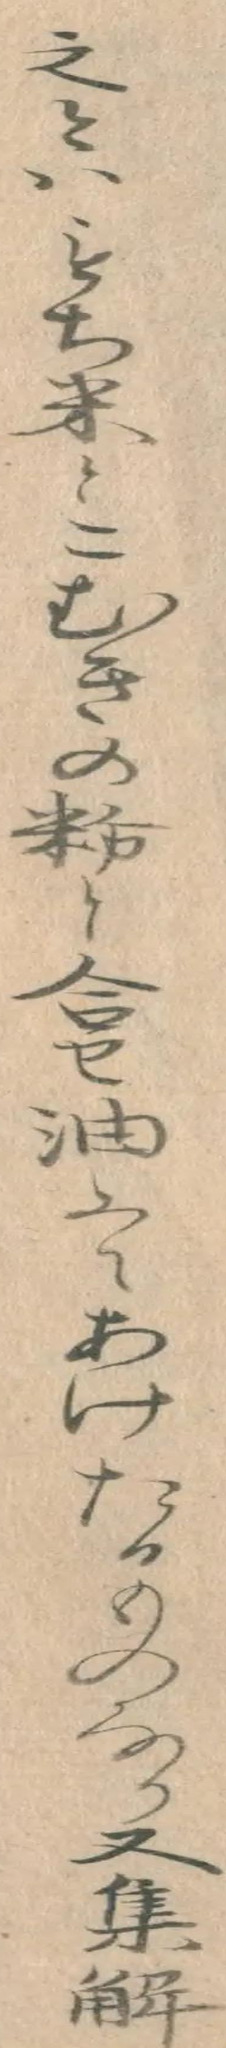之とはもち米とこむきの粉と合せ油にてあけたるものなり又集解
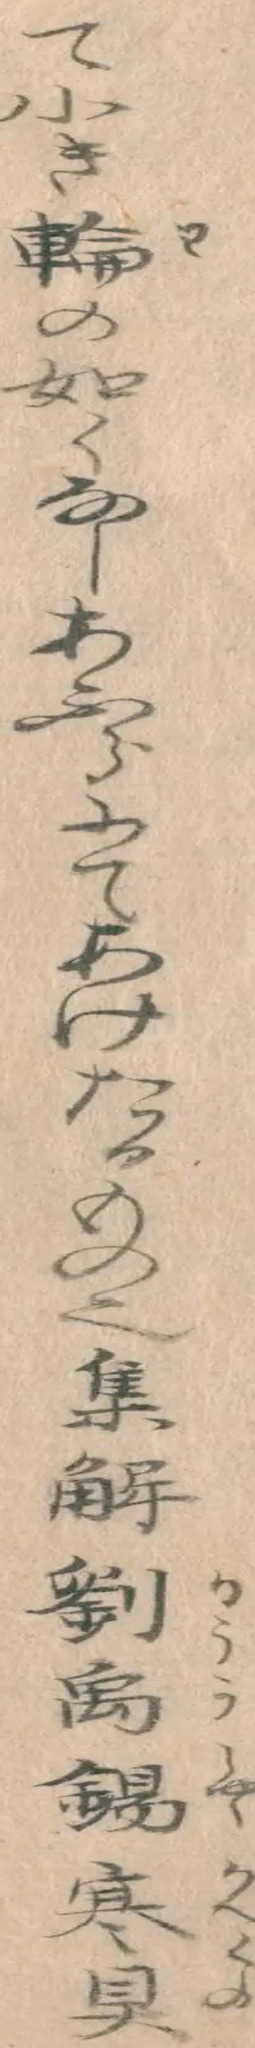て小き輪の如くなしあふらにてあけたるもの也集解劉禹錫寒具
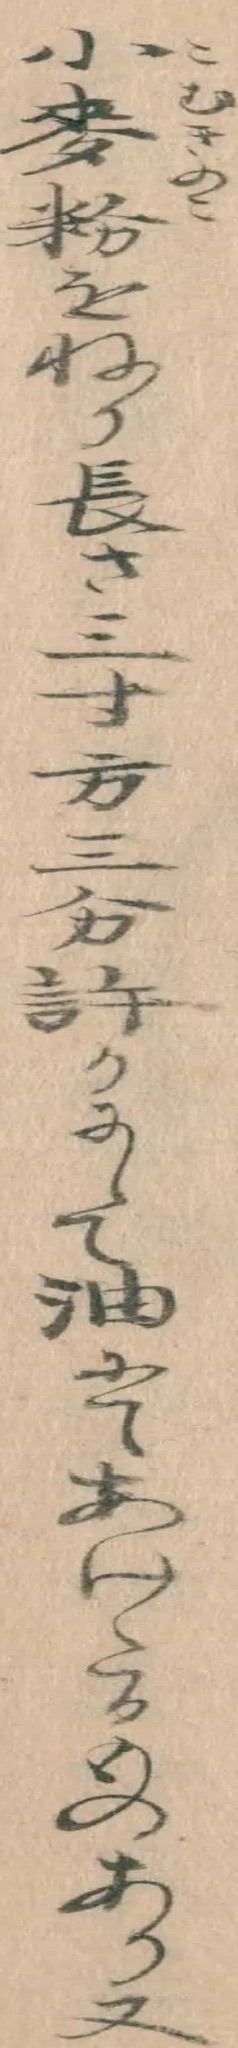小麦粉をねり長さ三寸方三分許りにして油にてあけたるものあり又
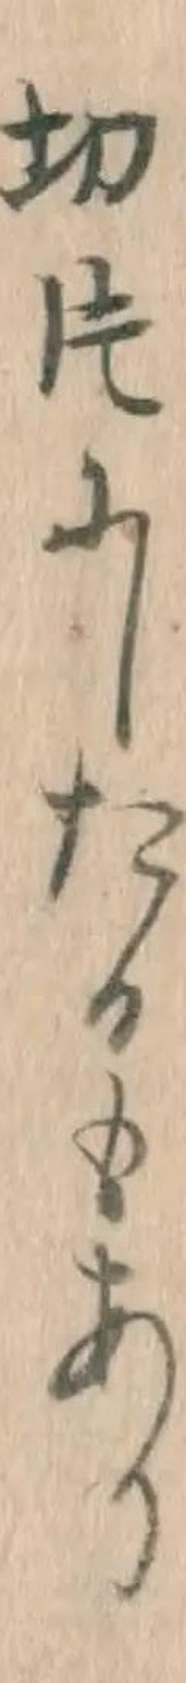切片にしたるもあり
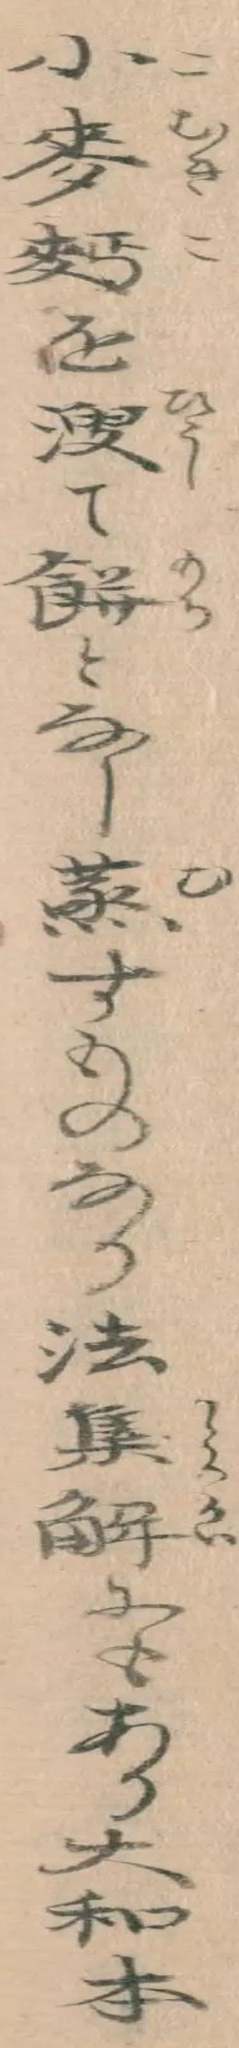小麦麺を溲て餅となし蒸すものなり法集解にもあり大和本
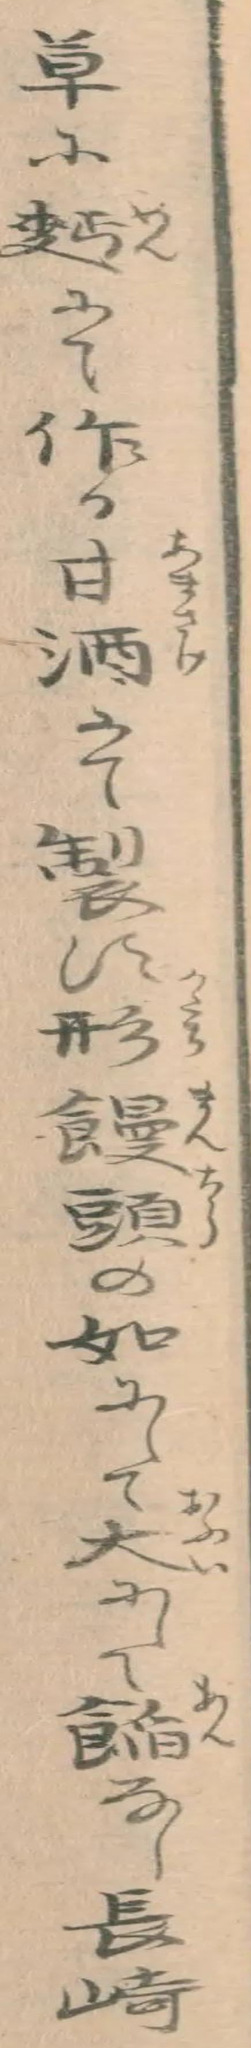草に麺にて作る甘酒にて製す形饅頭の如にして大にして餡なし長崎
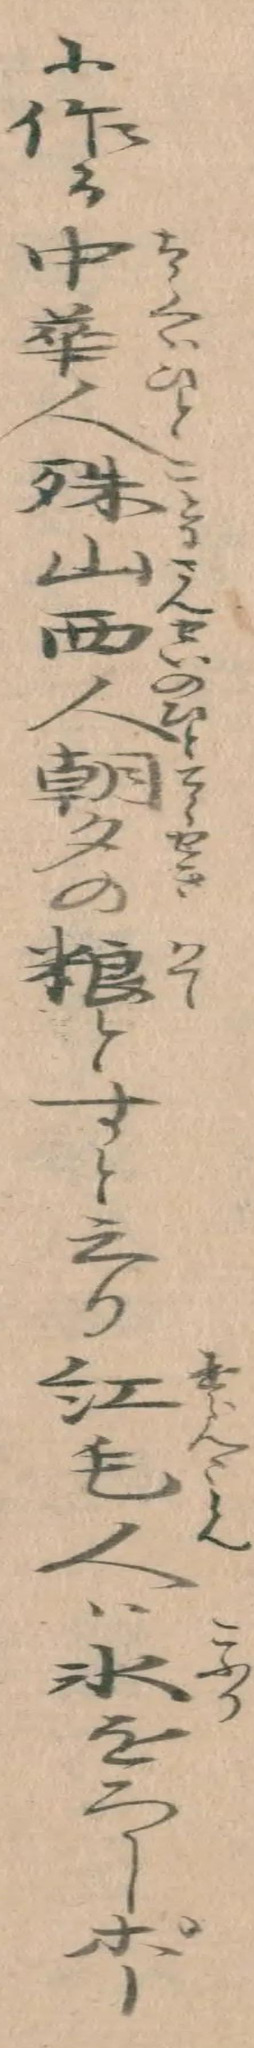に作る中華人殊山西人朝夕の糧とすと云り紅毛人は氷をろしポー
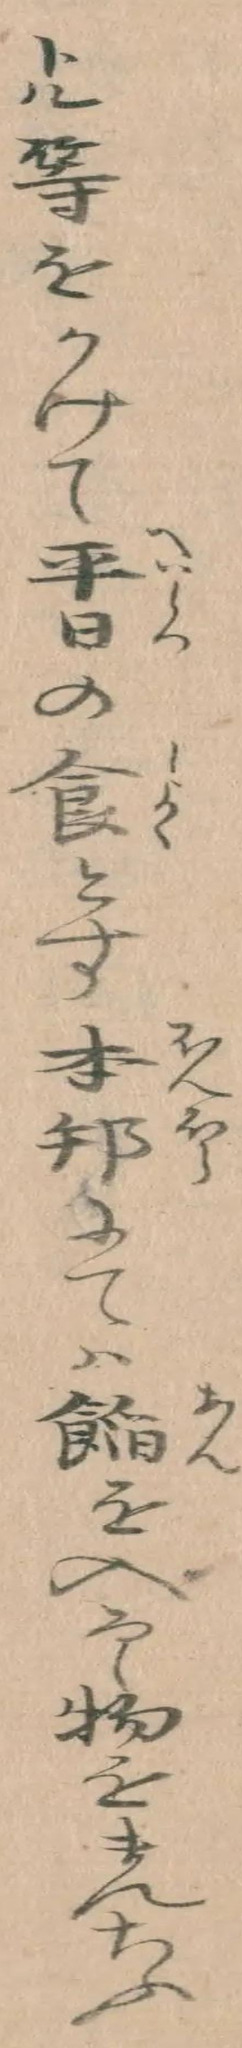トル等をかけて平日の食とす本邦にては餡を入る〱物をまんちふ
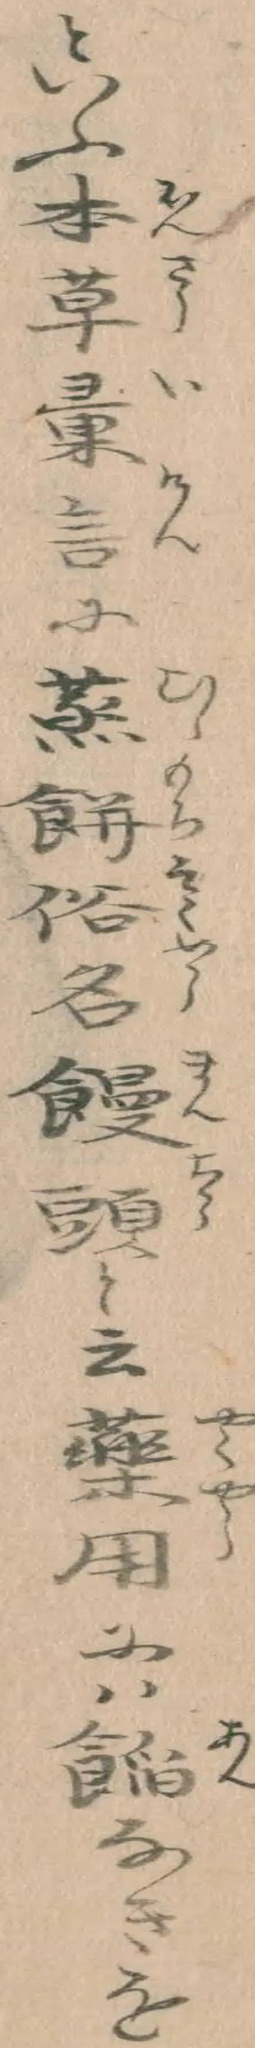といふ本草彙言に蒸餅俗名饅頭と云薬用には餡なきを
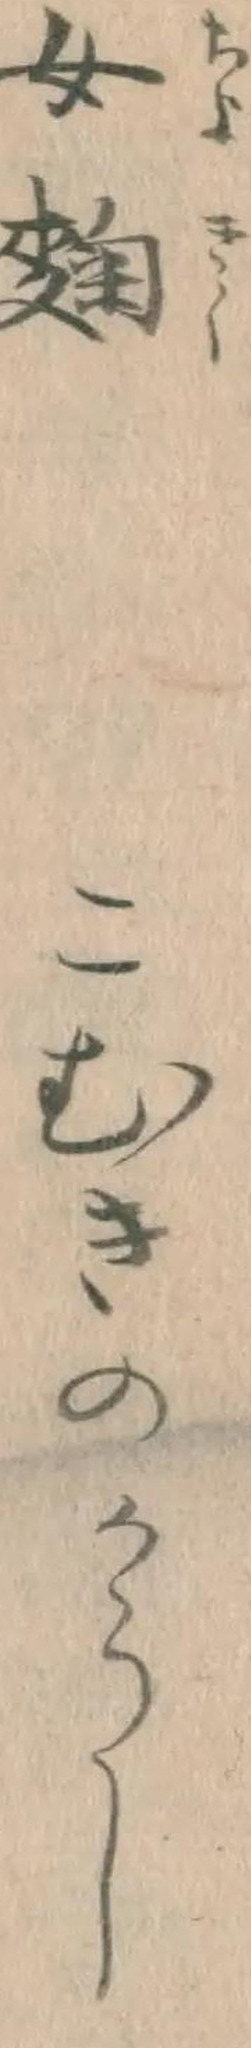女麹こむきのかうし
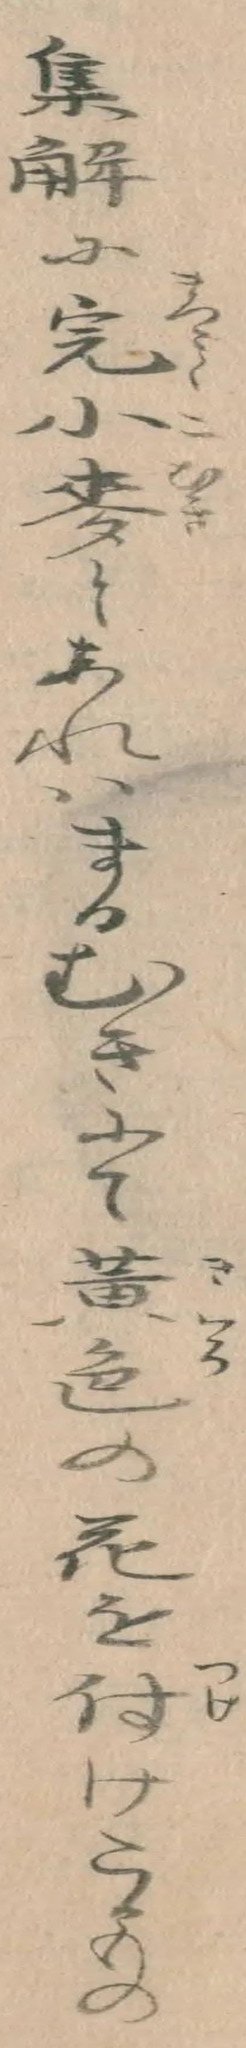集解に完小麦とあれはまるむきにて黄色の花を付けたるもの
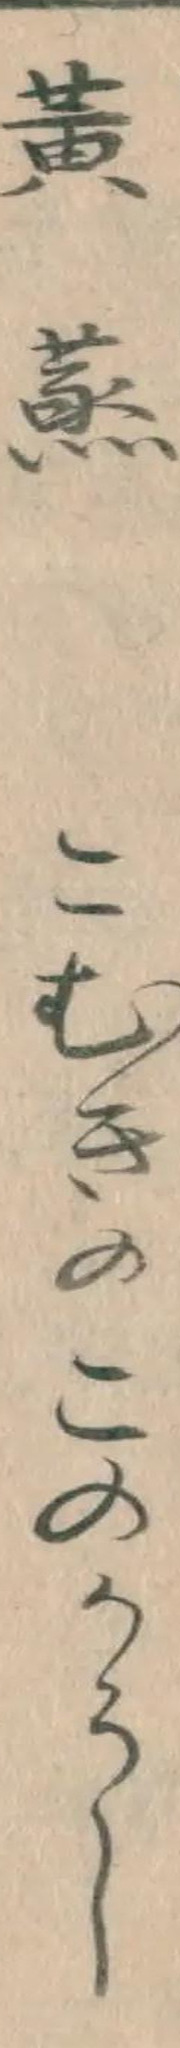黄蒸こむきのこのかうし
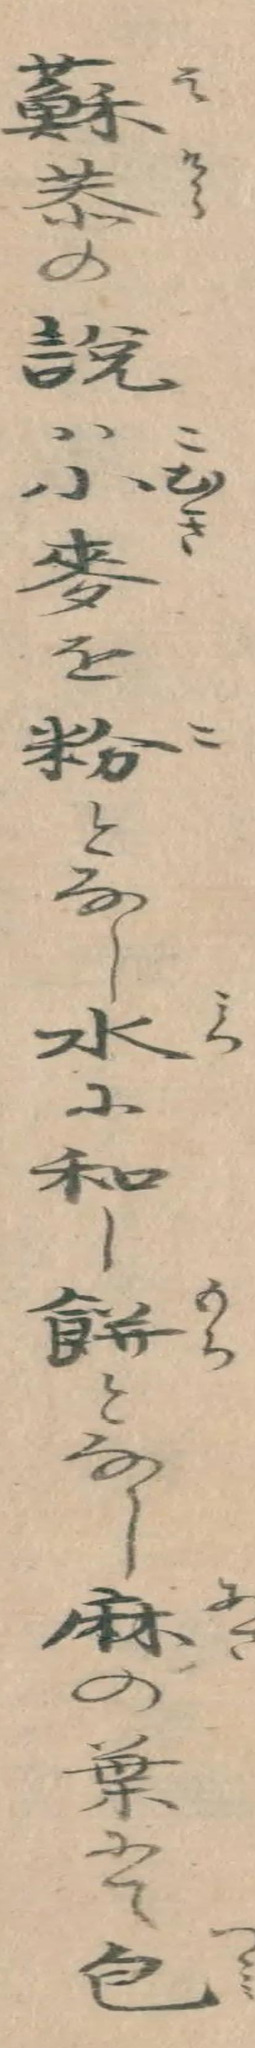蘇恭の説は小麦を粉となし水に和し餅となし麻の葉にて包

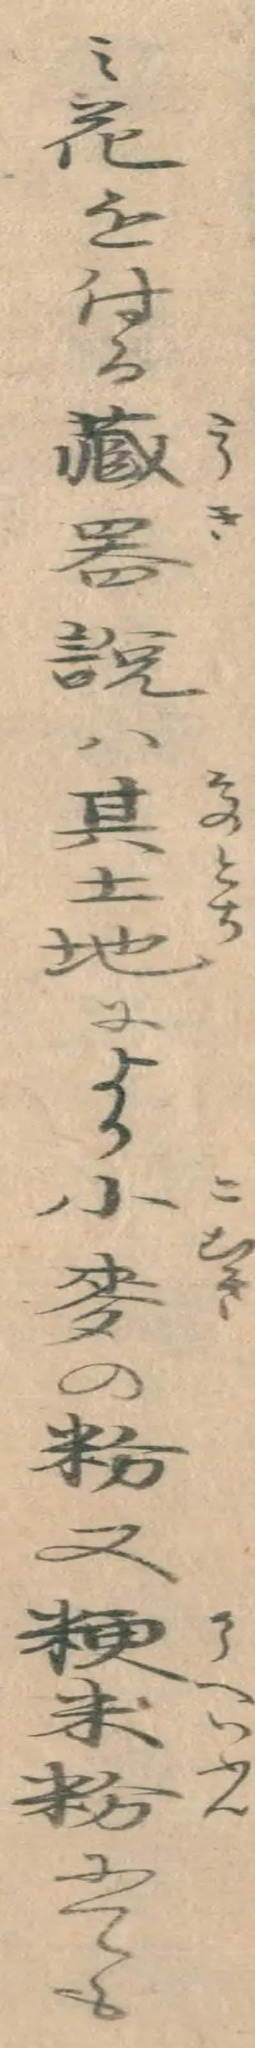み花を付る蔵器説は其土地により小麦の粉又粳米粉にても
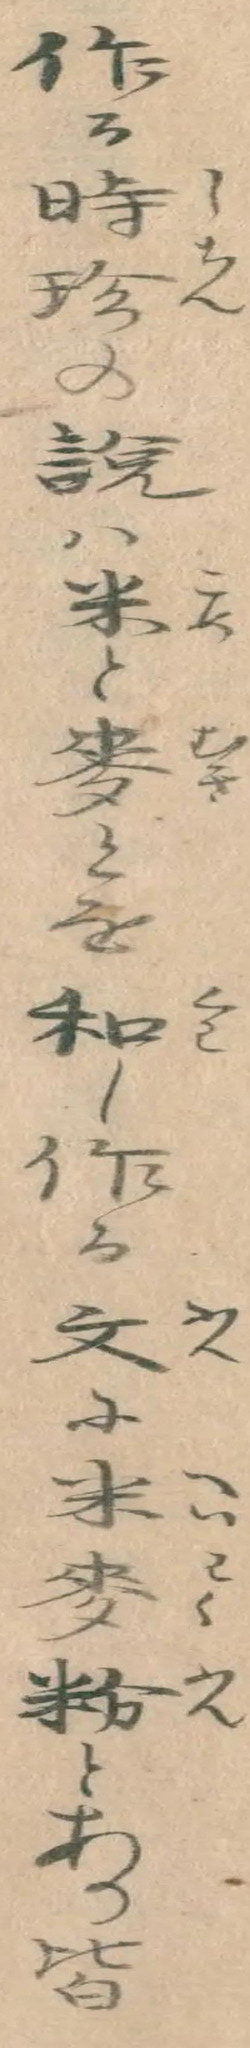作る時珍の説は米と麦とを和し作る文に米麦粉とあり皆
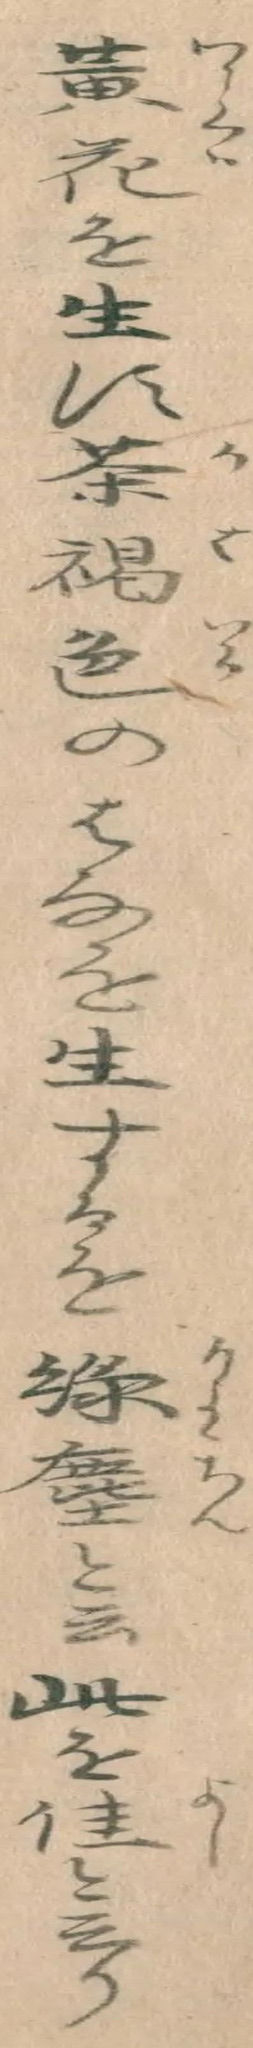黄花を生す茶褐色のはなを生するを緑塵と云此を佳と云り
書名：本草図譜. 巻43-45
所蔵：国立国会図書館 National Diet Library, JAPAN
